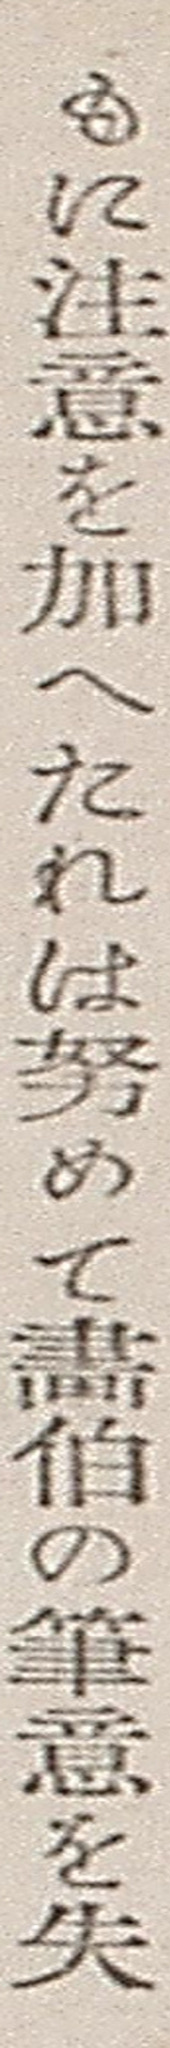もに注意を加へたれは努めて画伯の筆意を失
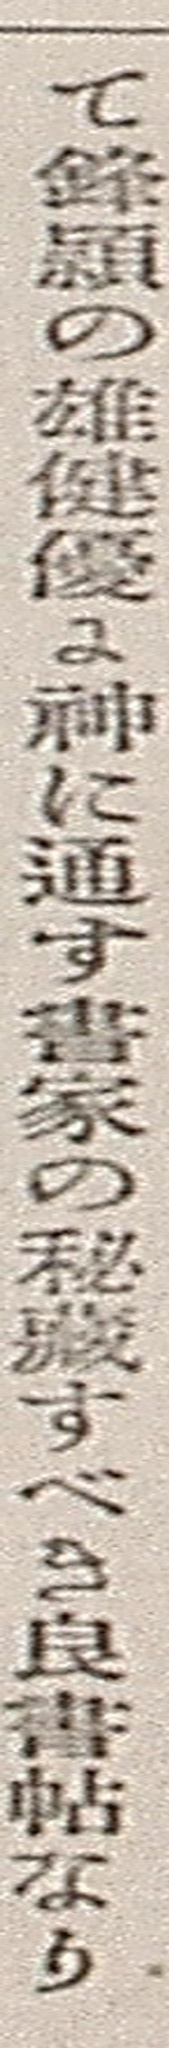て鋒頴の雄健優に神に通す書家の秘蔵すべき良書帖なり
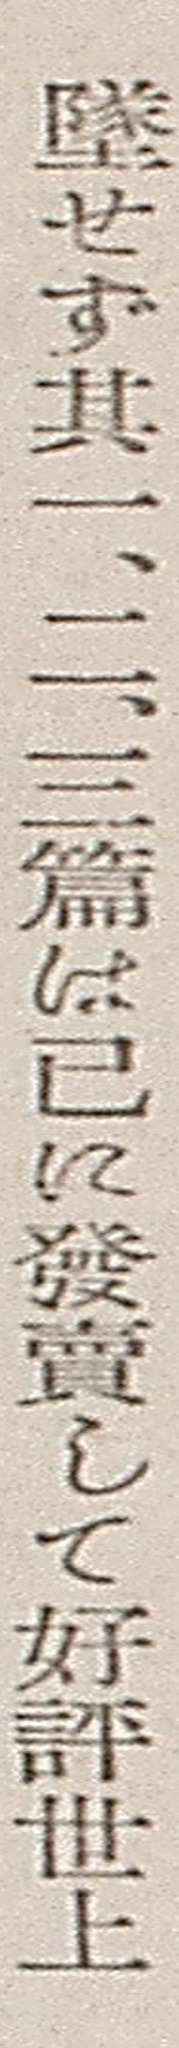墜せず其一、二、三篇は已に発売して好評世上
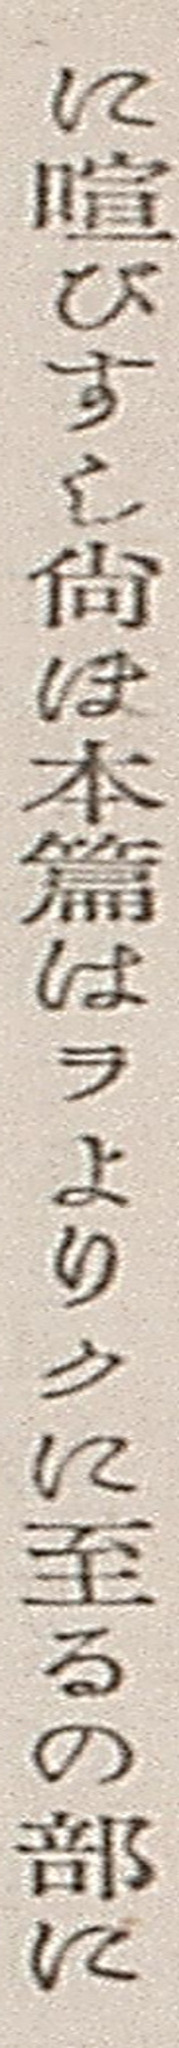に喧びすし尚ほ本篇はヲよりクに至るの部に
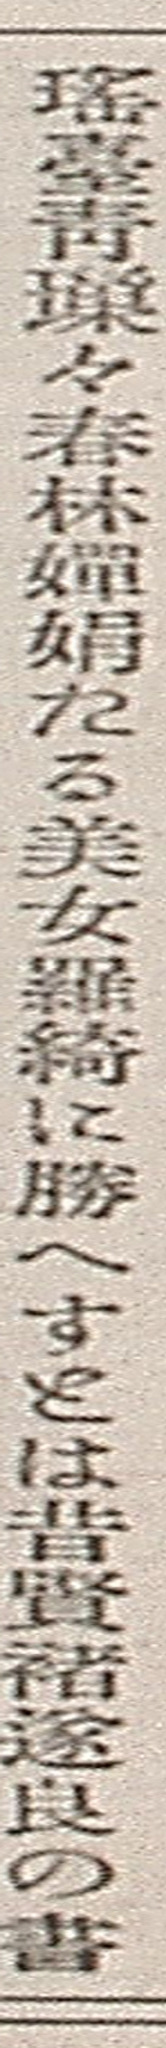瑶台青璅々春林嬋娟たる美女羅綺に勝へすとは昔賢褚遂良の書
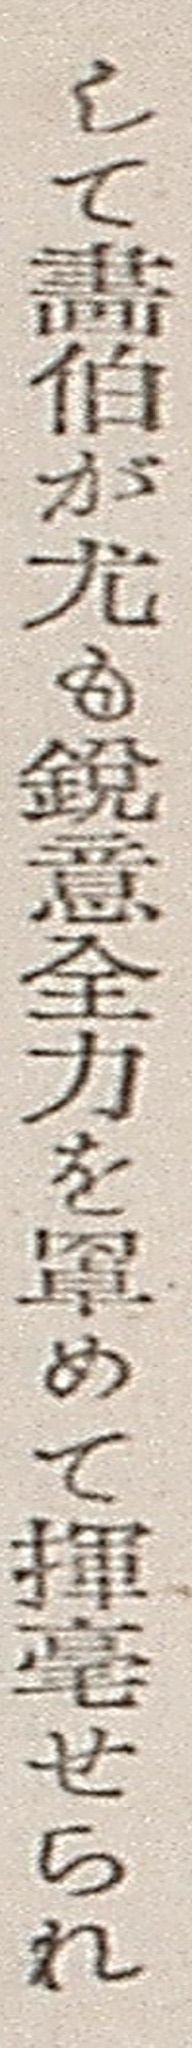して画伯が尤も鋭意全力を罩めて揮毫せられ
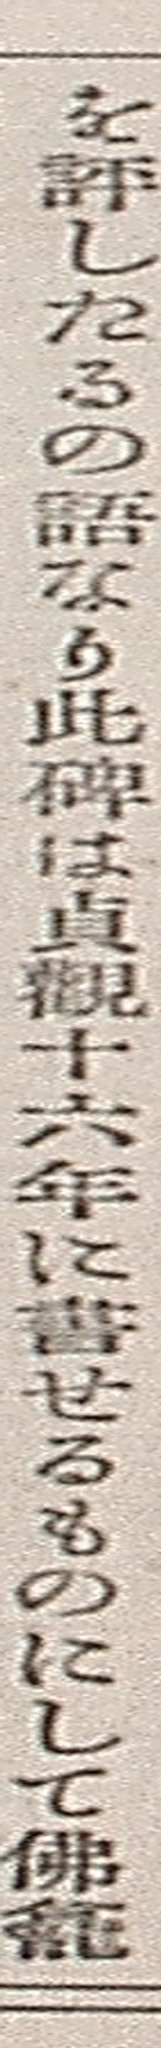を評したるの語なり此碑は貞観十六年に書せるものにして仏龕
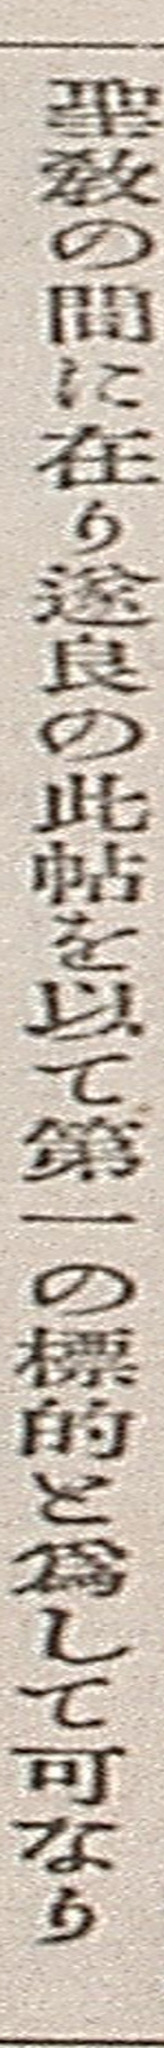聖教の間に在り遂良の此帖を以て第一の標的と為して可なり
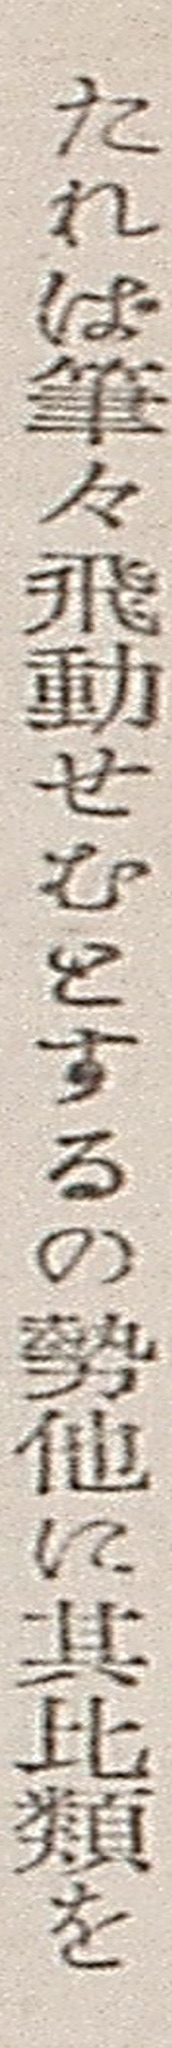たれば筆々飛動せむとするの勢他に其比類を
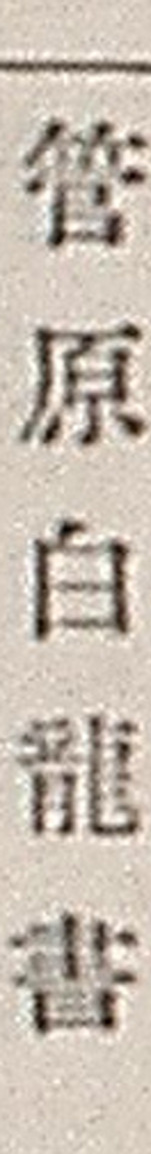菅原白龍書
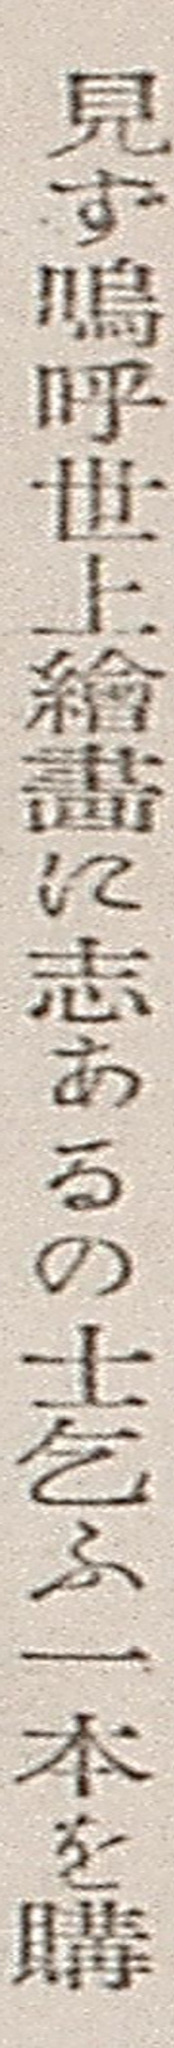見ず嗚呼世上絵画に志あるの士乞ふ一本を贖
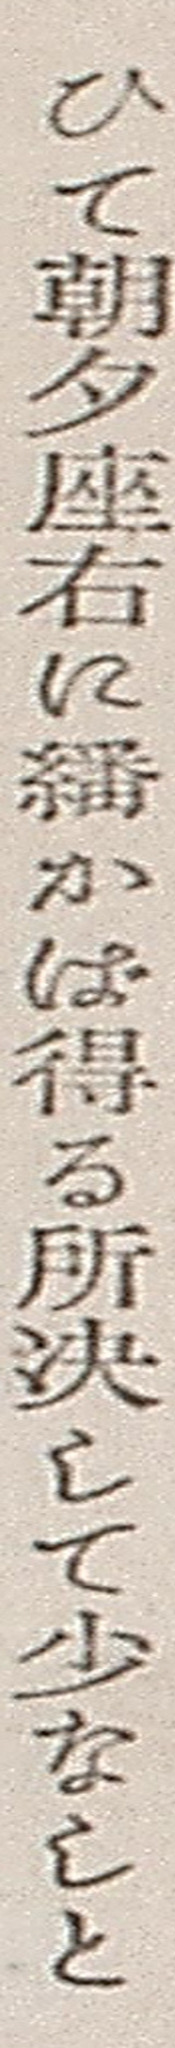ひて朝夕座右に繙かば得る所決して少なしと
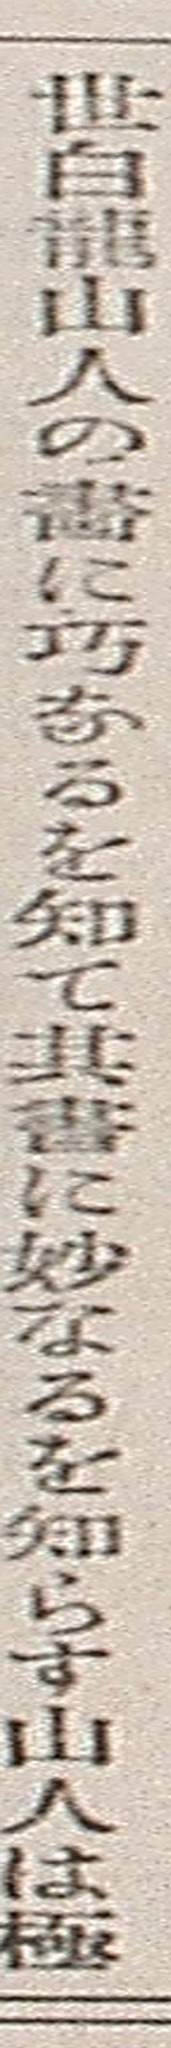世白龍山人の画に巧なるを知て其書に妙なるを知らす山人は極
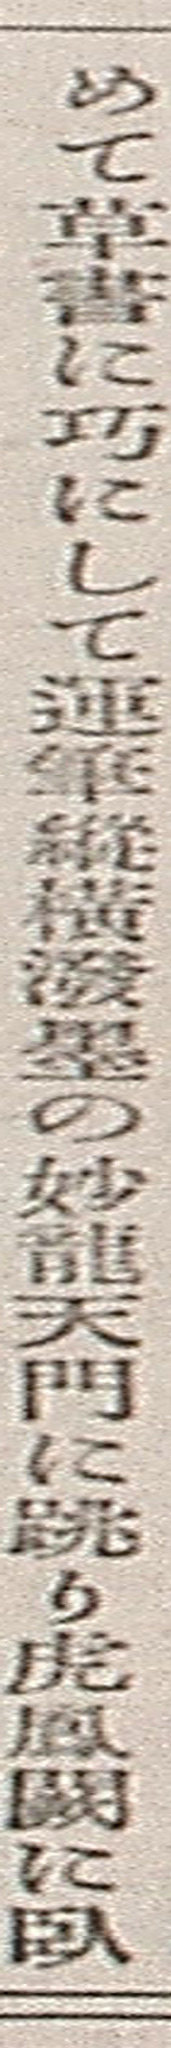めて草書に巧にして運筆縦横潑墨の妙龍天門に跳り虎鳳闕に臥
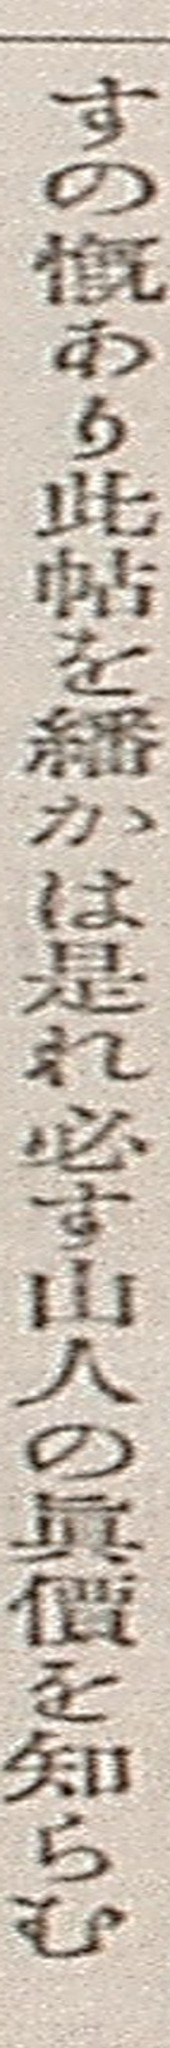すの慨あり此帖を繙かは是れ必す山人の真価を知らむ
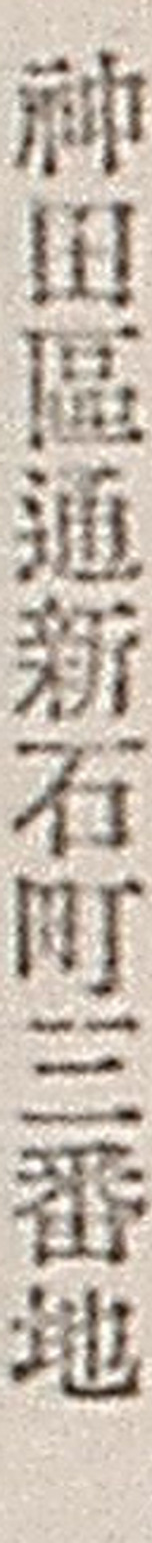神田区通新石町三番地
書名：風俗畫報臨時増刊第百二十四號　洪水地震被害録（上）
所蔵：東京大学地震研究所図書室 Earthquake Research Institute Library, The University of Tokyo, JAPAN
